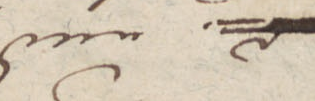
Gegenstandes woran
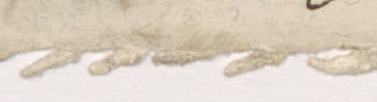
So muss ich auch noch
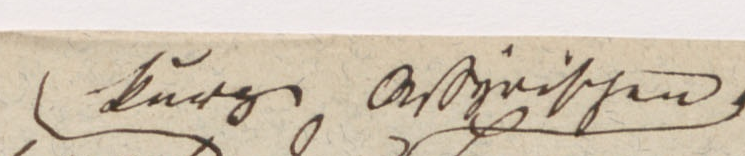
kurz der Assyrischen
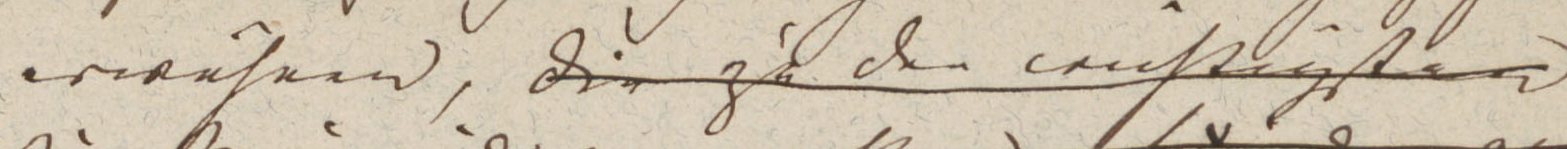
erwähnen, die zu den wichtigsten
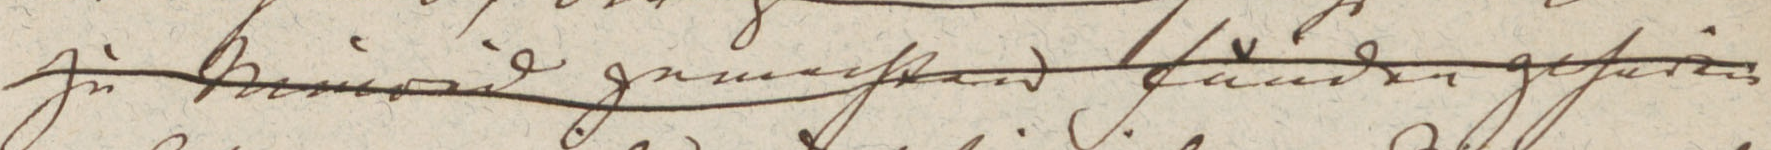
zu Nimrud gemachten Funden gehören
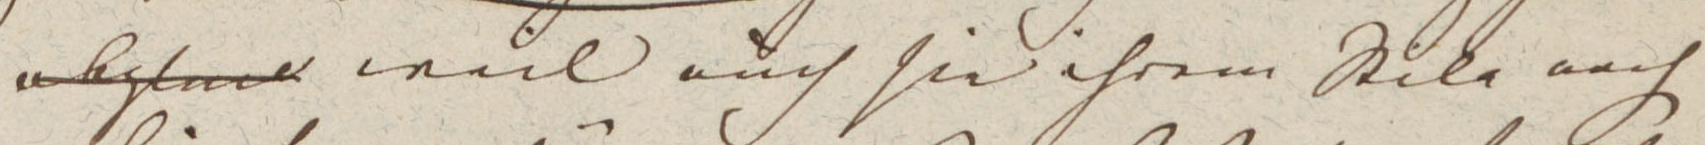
obgleich weil auch sie ihrem Stile nach
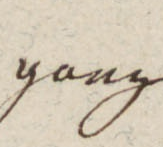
ganz
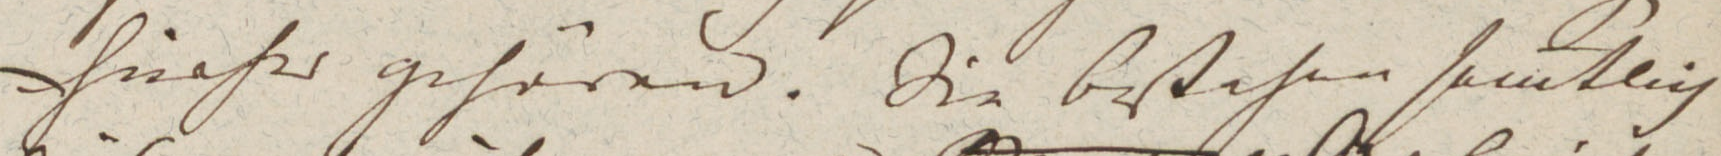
hierher gehören. Sie bestehen sammtlich
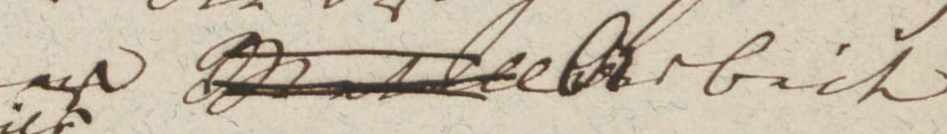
aus getriebenenr MetallaArbeit
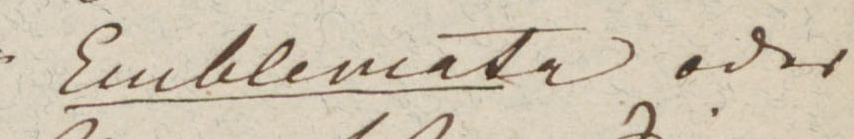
Emblemata oder
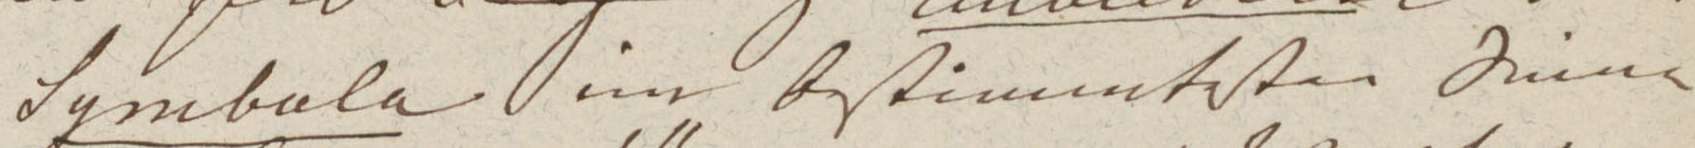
Symbola im bestimmten Sinne
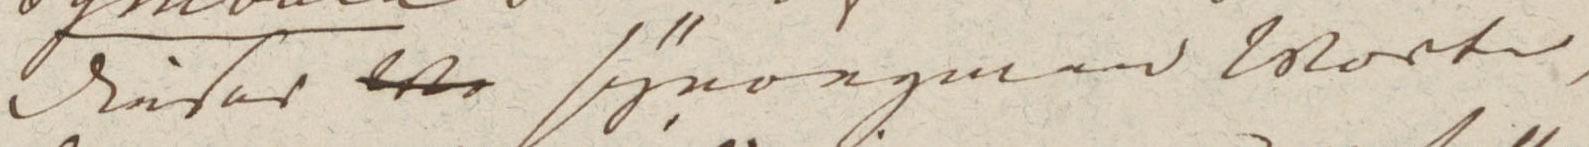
dieser Wo synonymen Worte,
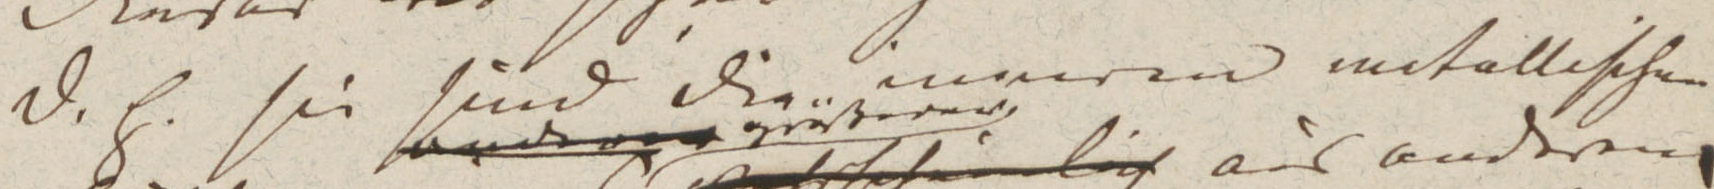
d.h. sie sind die inneren metallischen
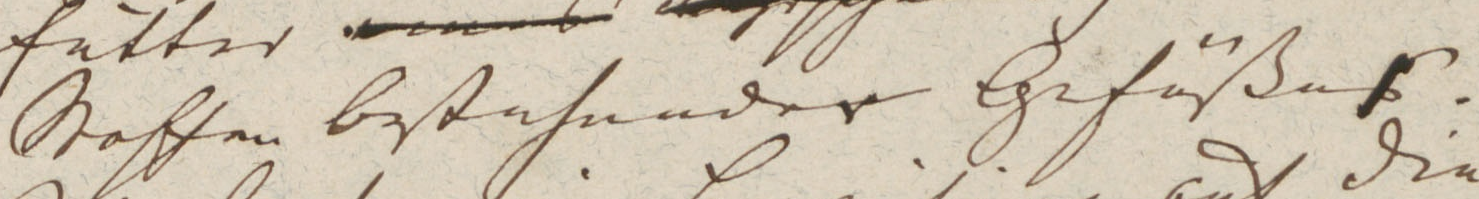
Stoffen bestehendenr Gefässes. %
